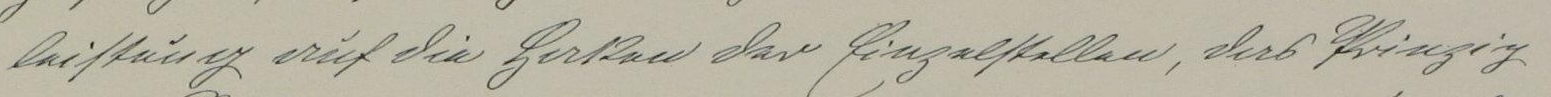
leistung auf die Haken der Einzelstellen, das Prinzip
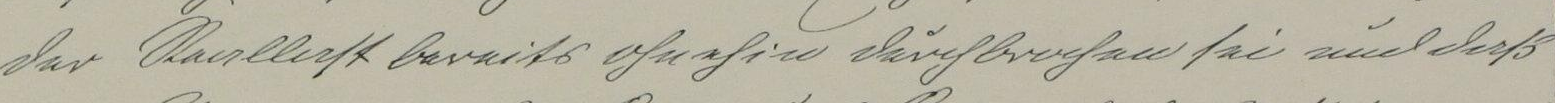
der Reallast bereits ohnehin durchbrochen sei und daß
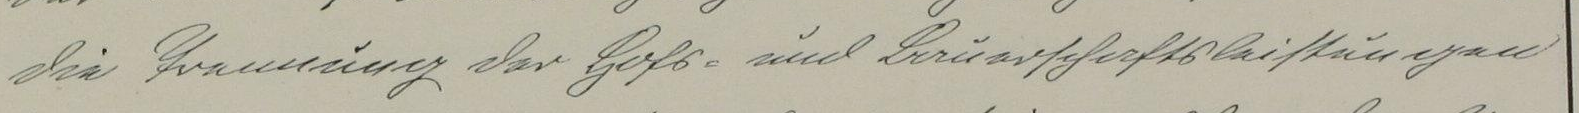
die Trennung der Hofs- und Bauerschaftsleistungen
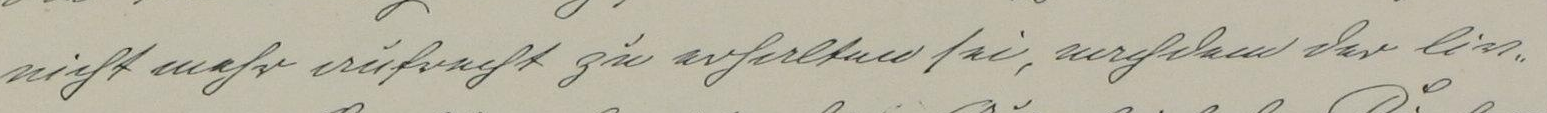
nicht mehr aufrecht zu erhalten sei, nachdem der liv-
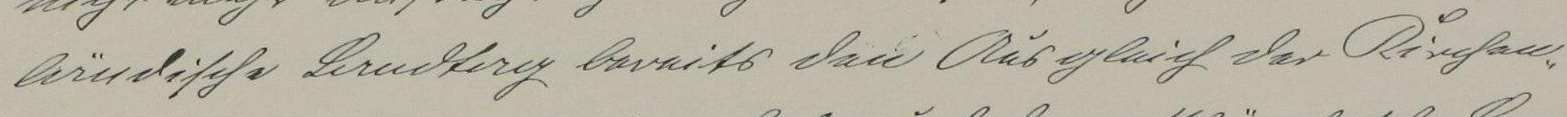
ländische Landtag bereits den Ausgleich der Kirchen-
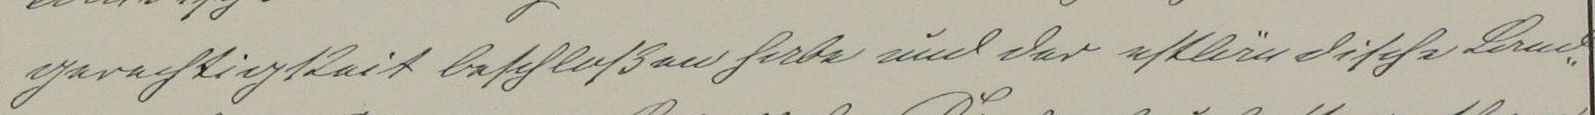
gerechtigkeit beschloßen habe und der estländische Land-
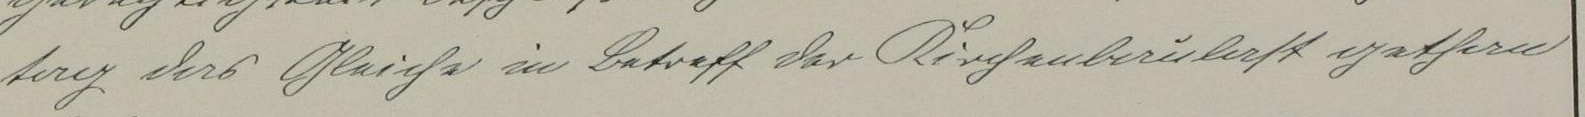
tag das Gleiche in Betreff der Kirchenbaulast gethan
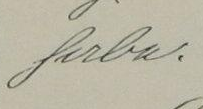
habe.
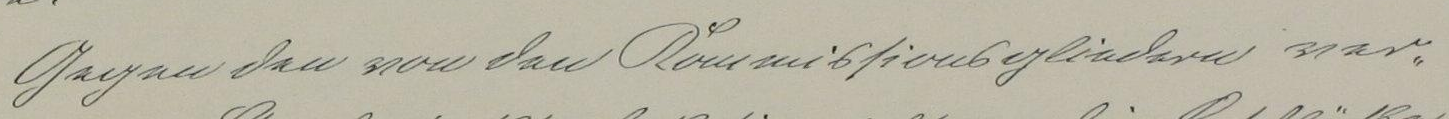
Gegen den von den Kommissionsgliedern ver-
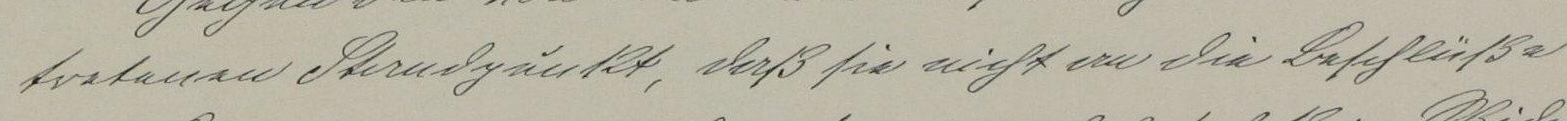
tretenen Standpunkt, daß sie nicht an die Beschlüße
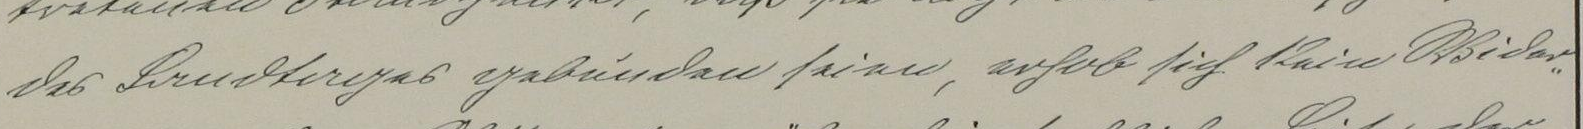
des Landtages gebunden seien, erhob sich kein Wider-
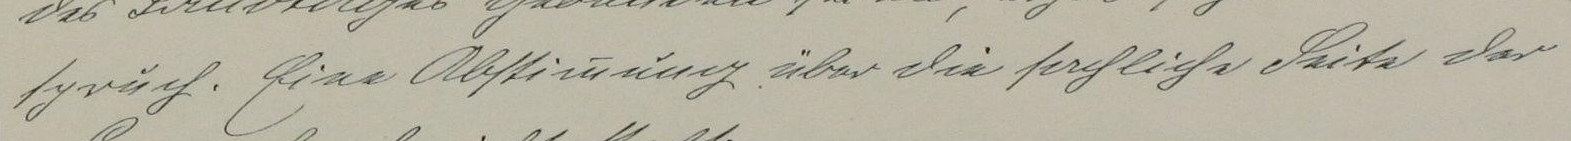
spruch. Eine Abstimmung über die sachliche Seite der
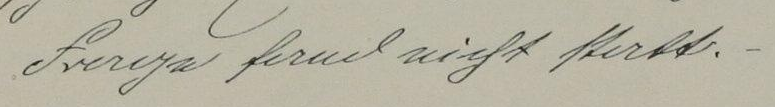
Frage fand nicht statt.
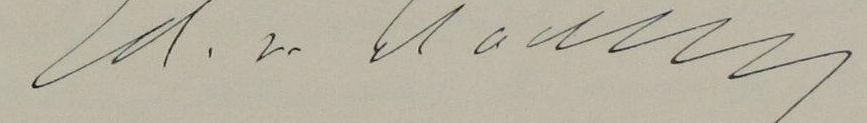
Ed. v. Stackelberg
